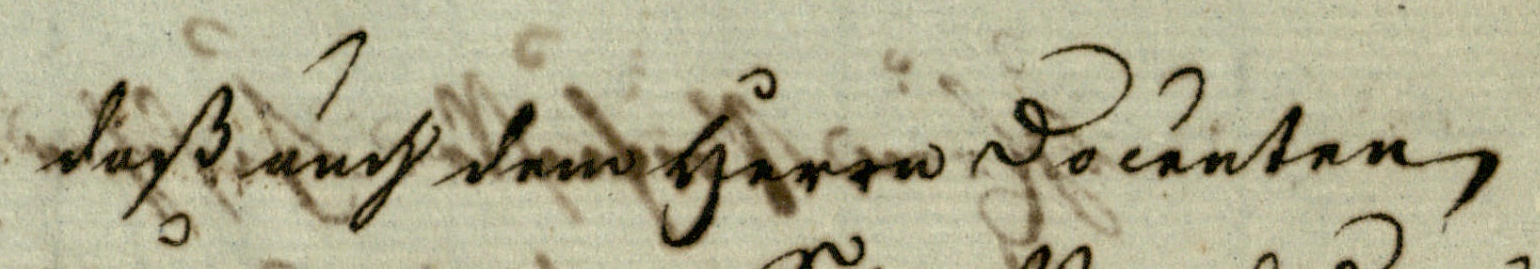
daß auch dem Herrn Docenten
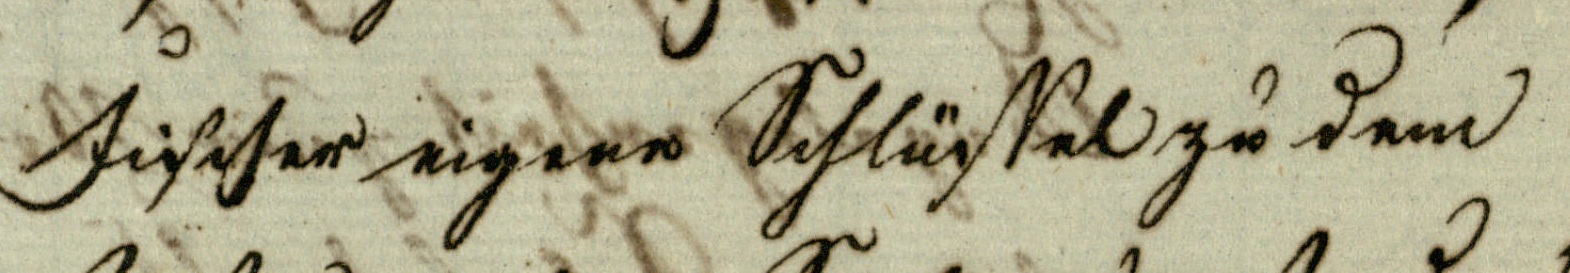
Fischer eigene Schlüssel zu dem
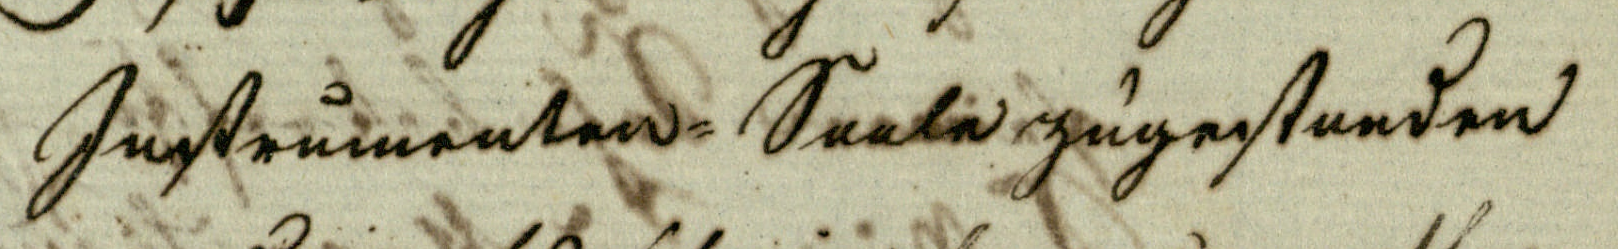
Instrumenten- Saale zugestanden
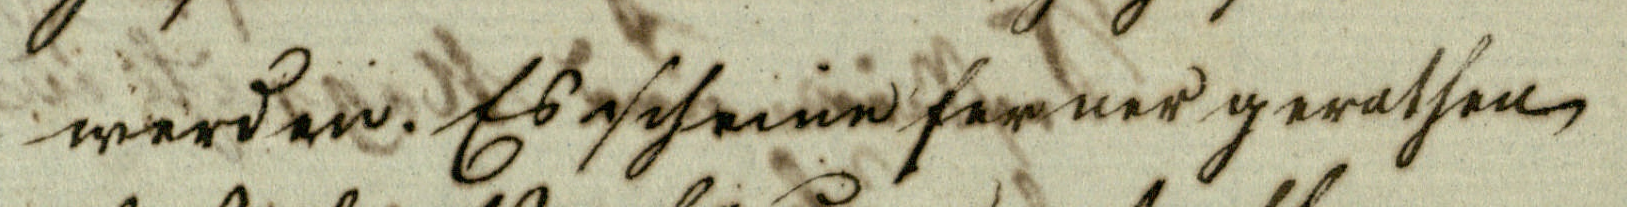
werden. Es scheine ferner gerathen
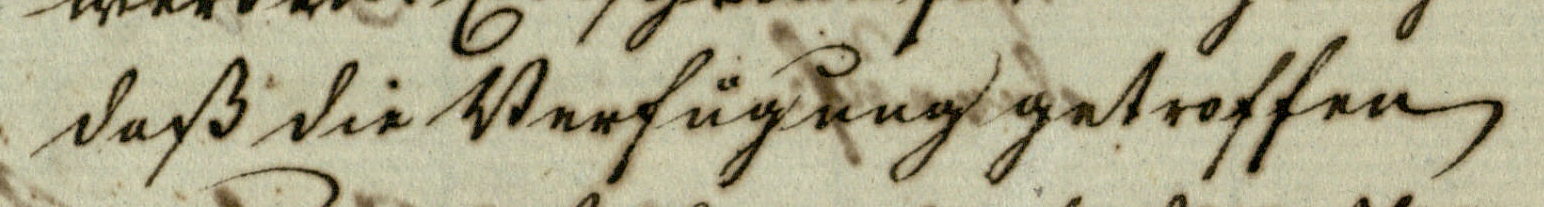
daß die Verfügung getroffen
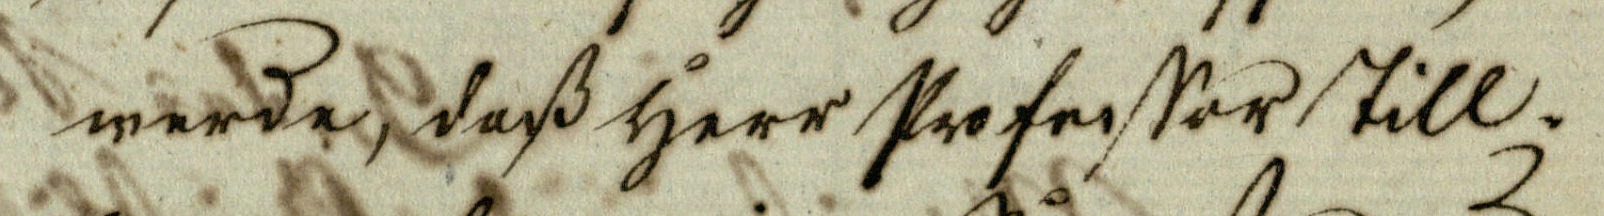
würde, daß Herr Professor Till¬
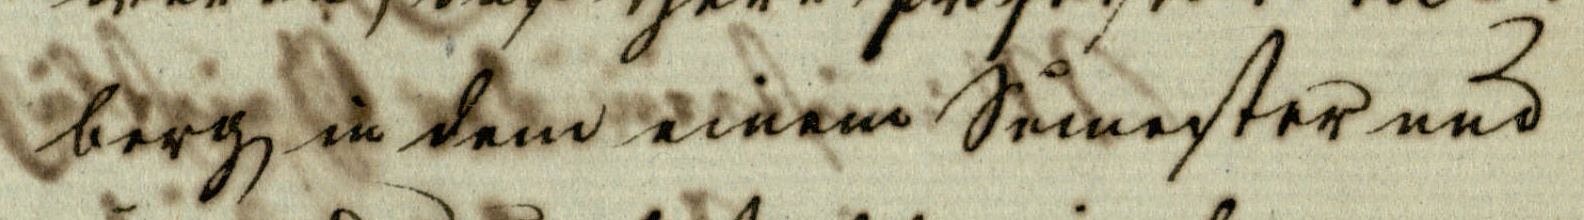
berg in dem einem Semester und
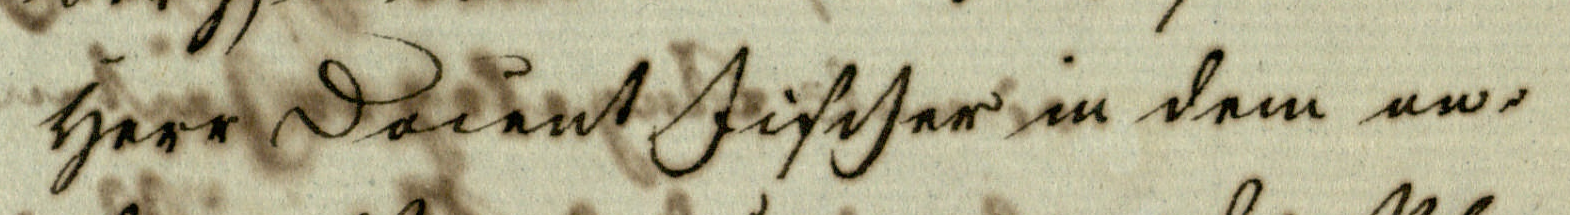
Herr Docent Fischer in dem an¬
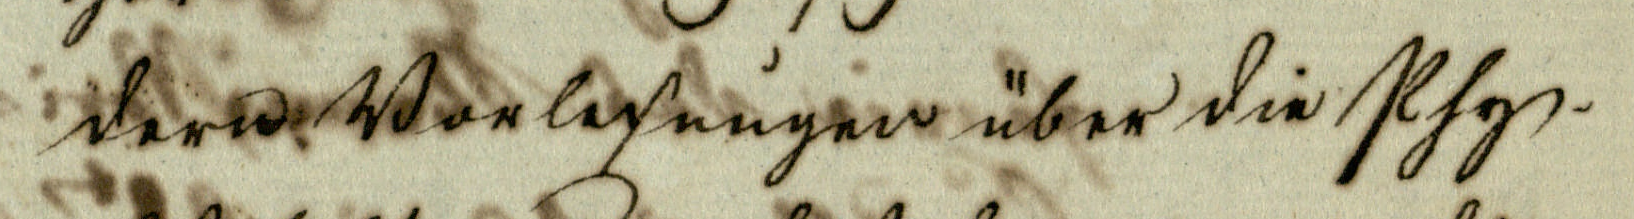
dern Vorlesungen über die Phy¬
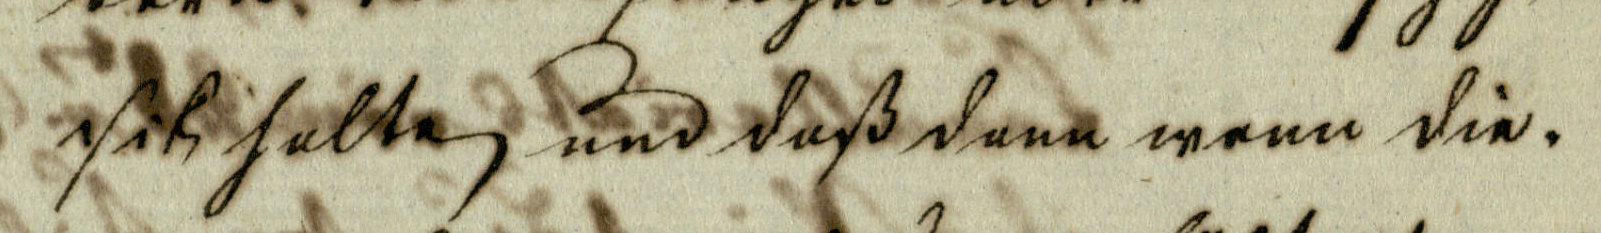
sik halte und daß denn wenn die¬
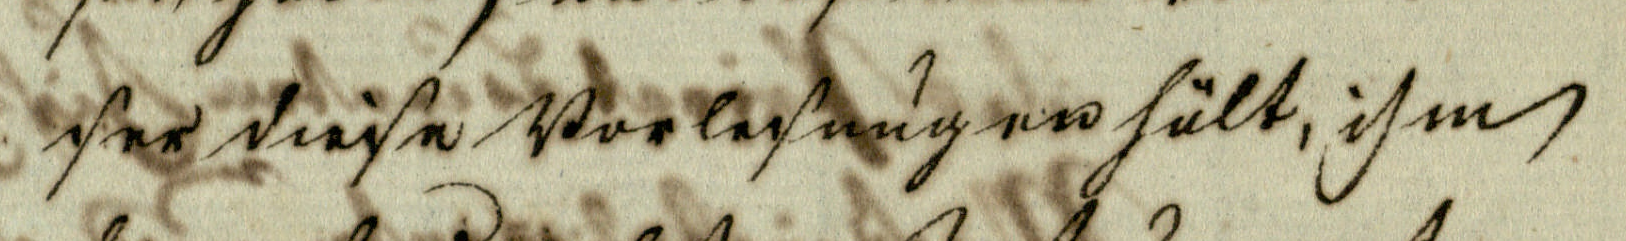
ser diese Vorlesungen hält, ihm
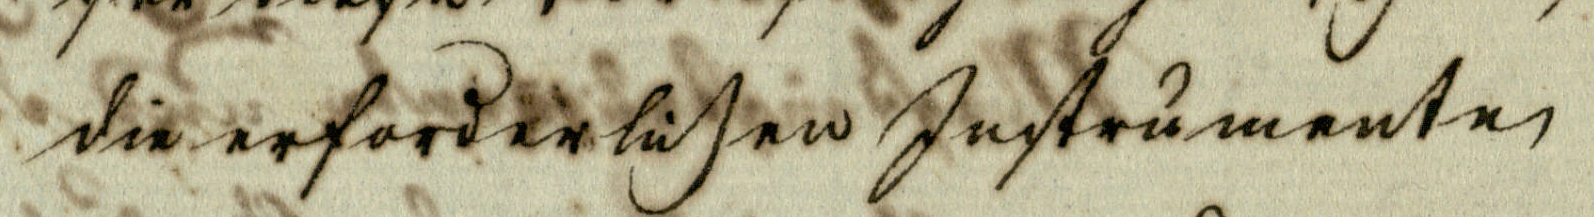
die erforderlichen Instrumente
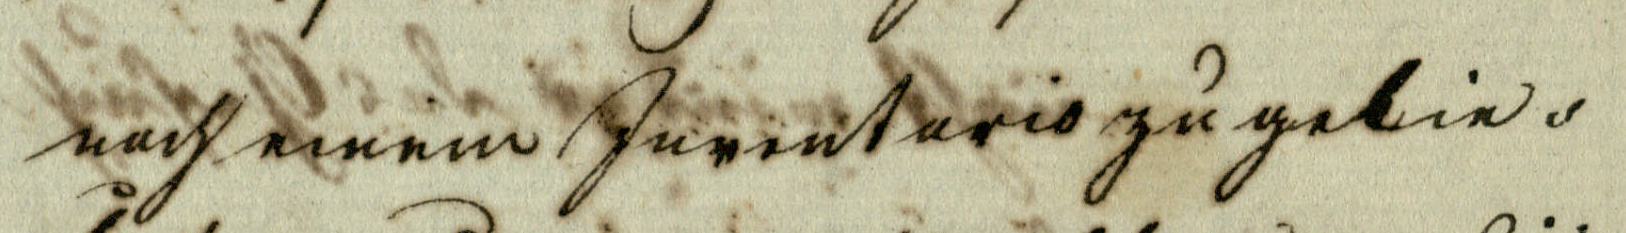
mit einem Inventario zu gelie¬
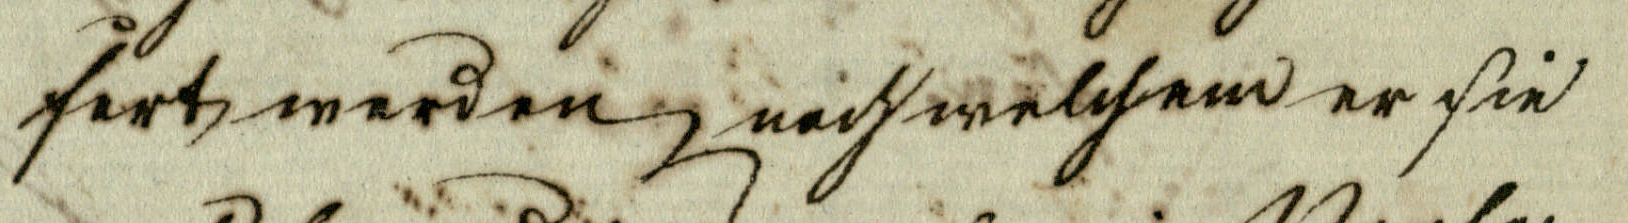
fert werden, nach welchem er sie
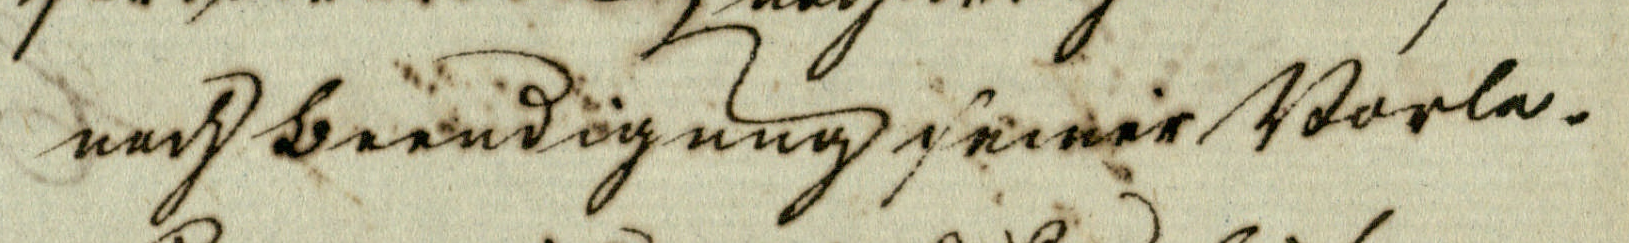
nach Beendigung seiner Vorle¬
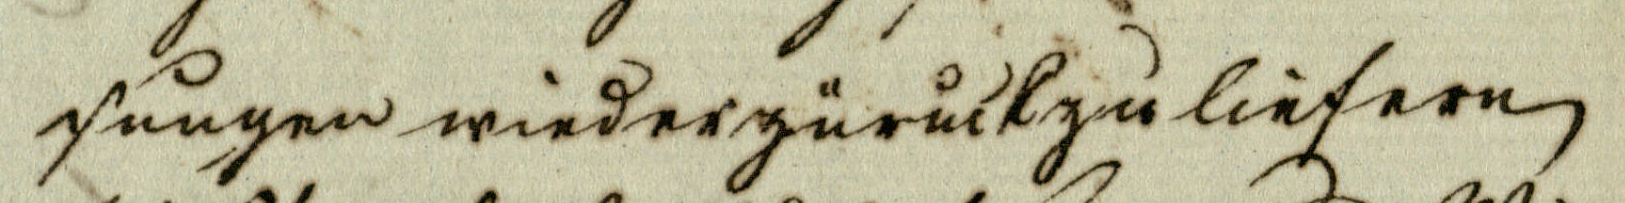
sungen wiederzurückzuliefern
